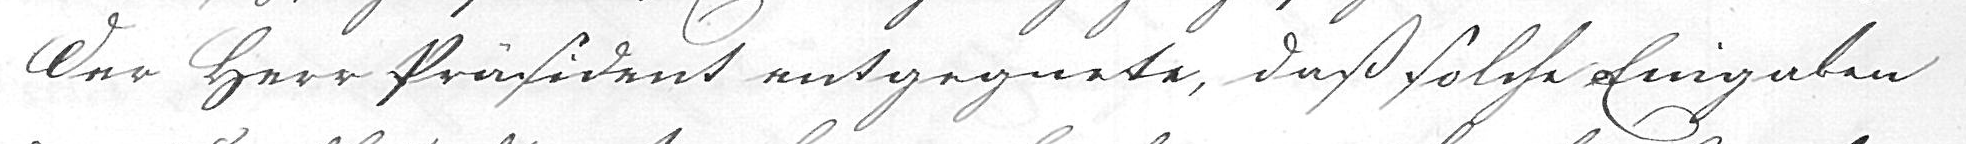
Der Herr Präsident entgegenete, daß solche Eingaben
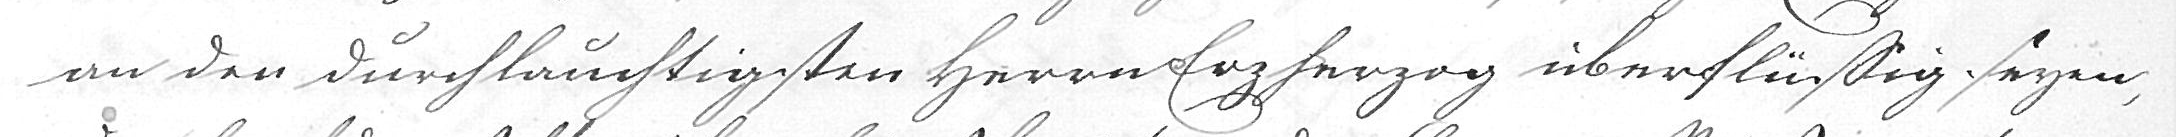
an den durchlauchtigsten Herrn Erzherzog überflüssig seyen,
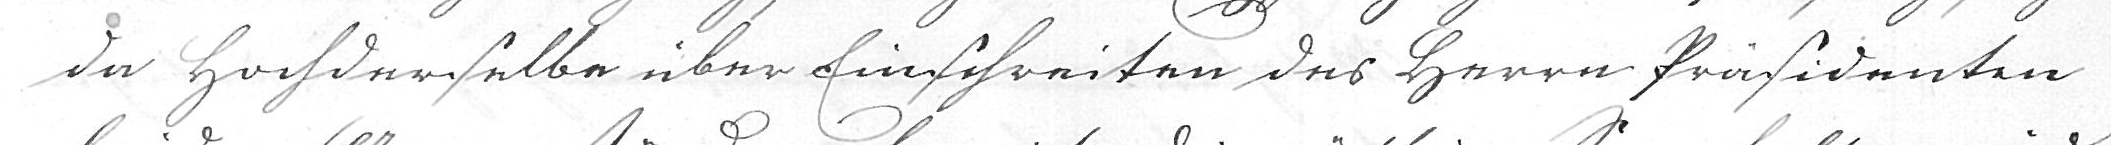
da Hochderselbe über Einschreiten des Herrn Präsidenten
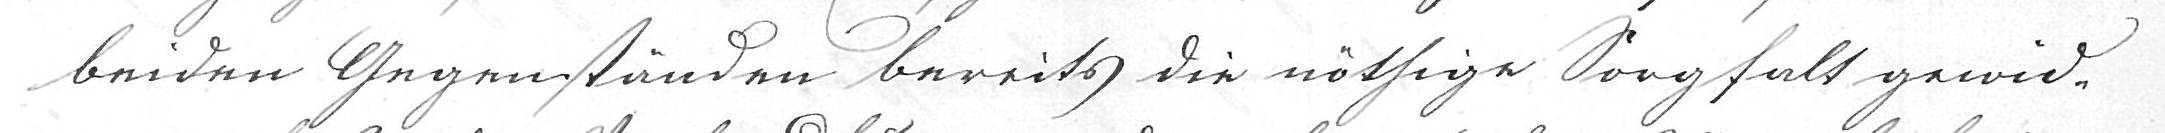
beiden Gegenständen bereits die nöthige Sorgfalt gewid-
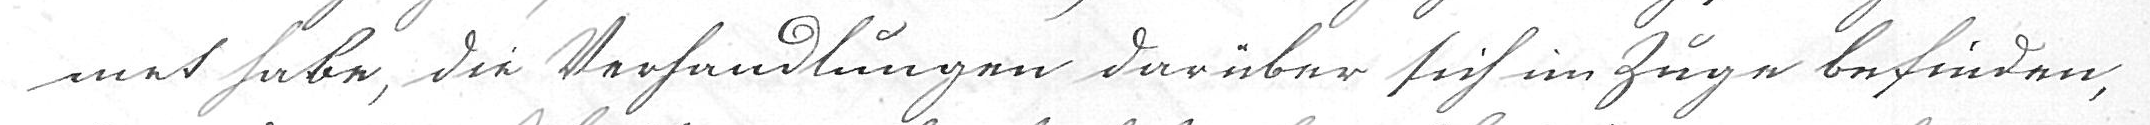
met habe, die Verhandlungen darüber sich im zuge befinden,
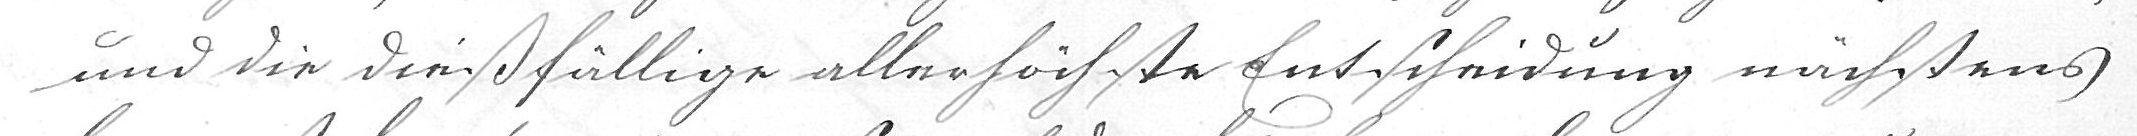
und die dießfällige allerhöchste Entscheidung nächstens
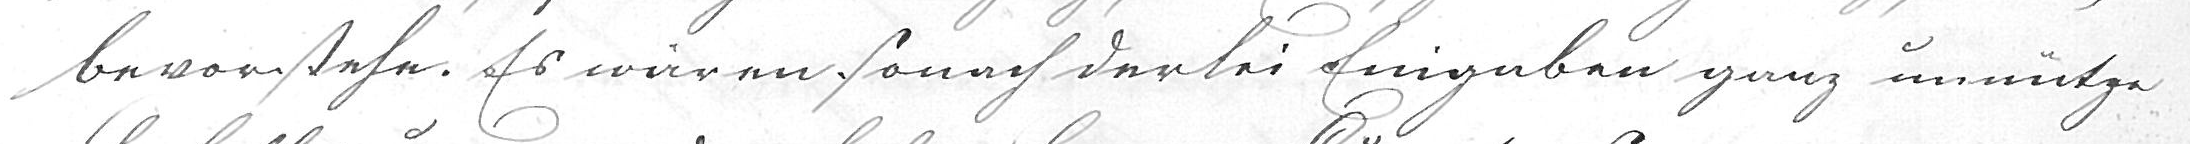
bevorstehe. Es wären sonach derlei Eingaben ganz unnütze
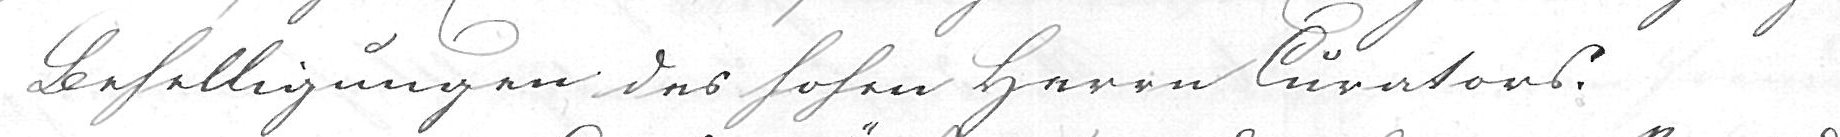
Behelligungen des hohen Herrn Curators.
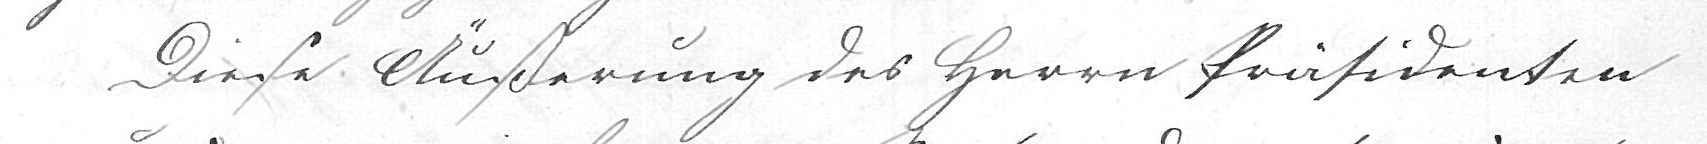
Deise Äußerung des Herrn Präsidenten
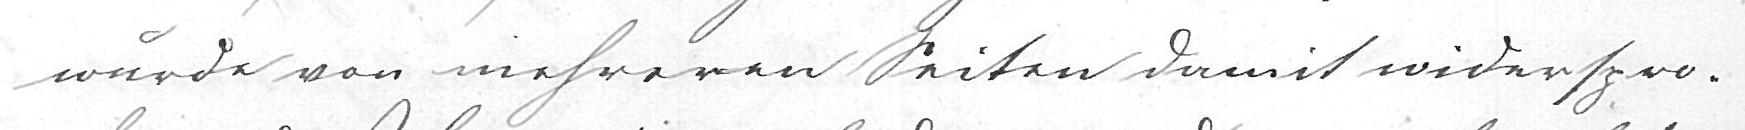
wurde von mehreren Seiten damit widerspro-
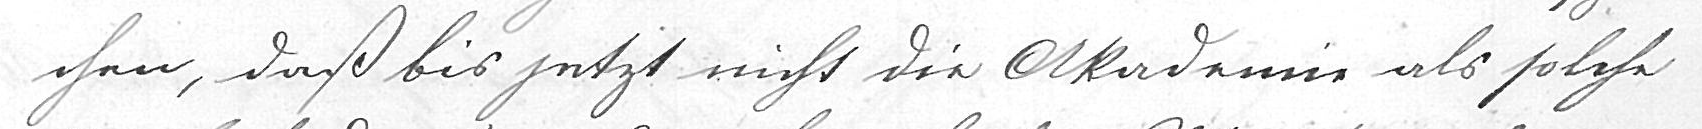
chen, daß bis jetzt nicht die Akademie als solche
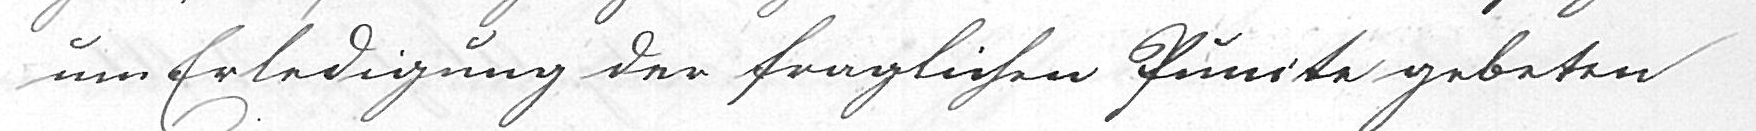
um Erledigung der fraglichen Puncte gebeten
